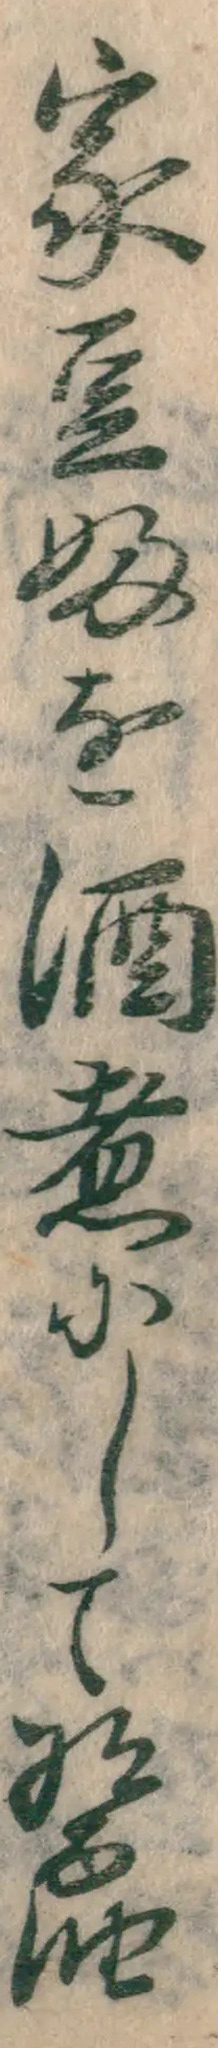家豆ふを酒煮にして醤油
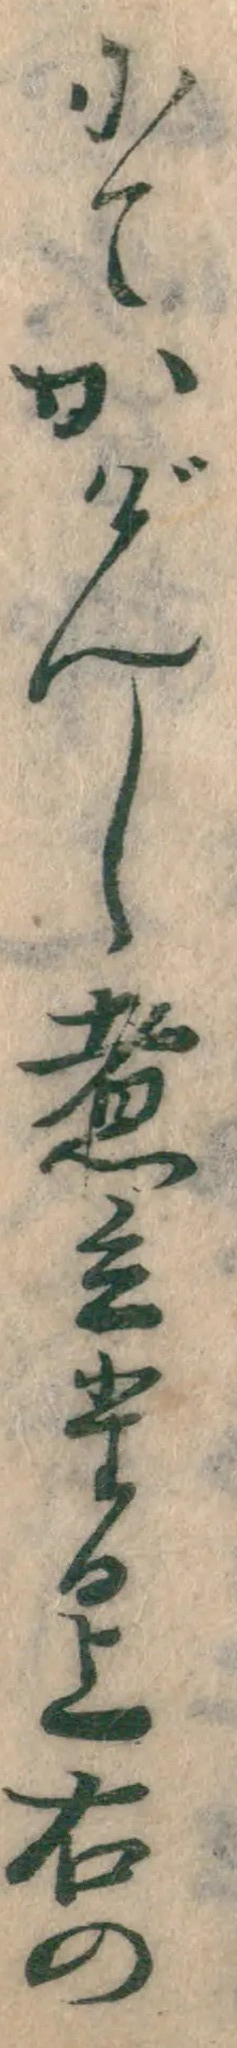にてかげんし煮立たる上右の

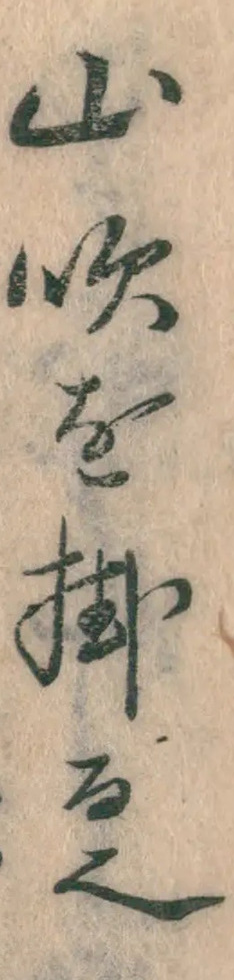山吹を掛る也
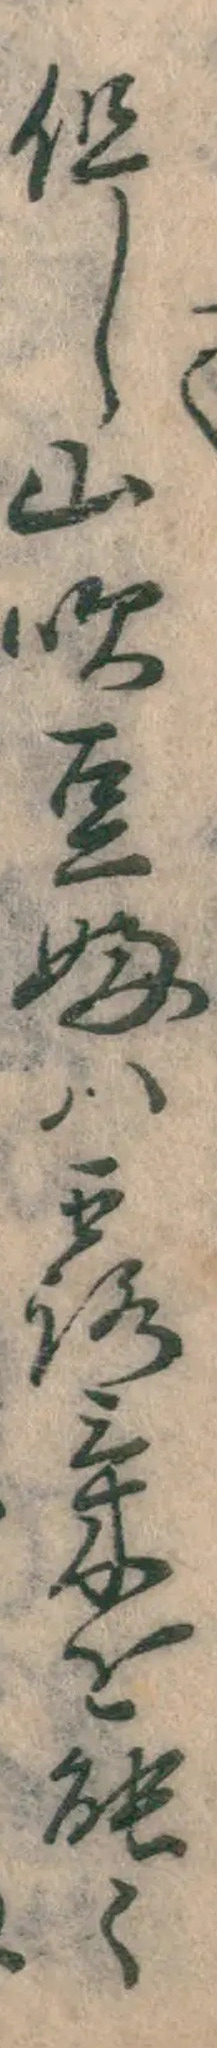但し山吹豆ふは露気を能く
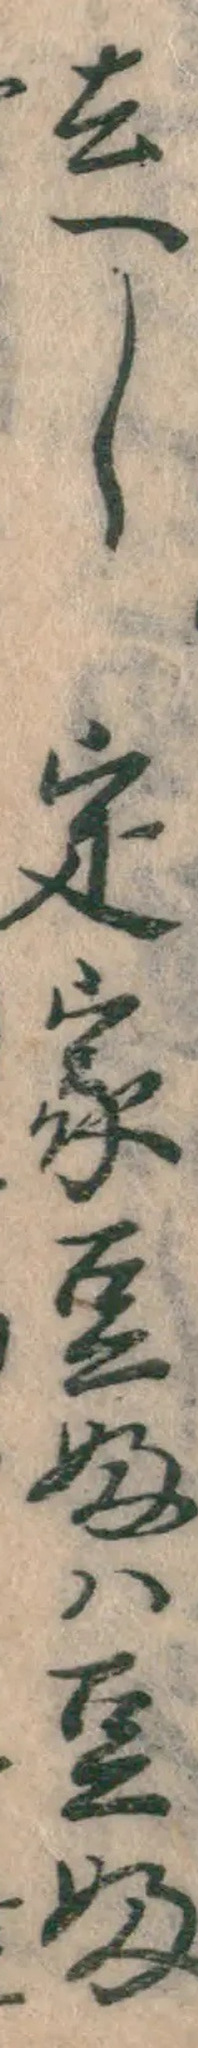去へし定家豆ふは豆ふ
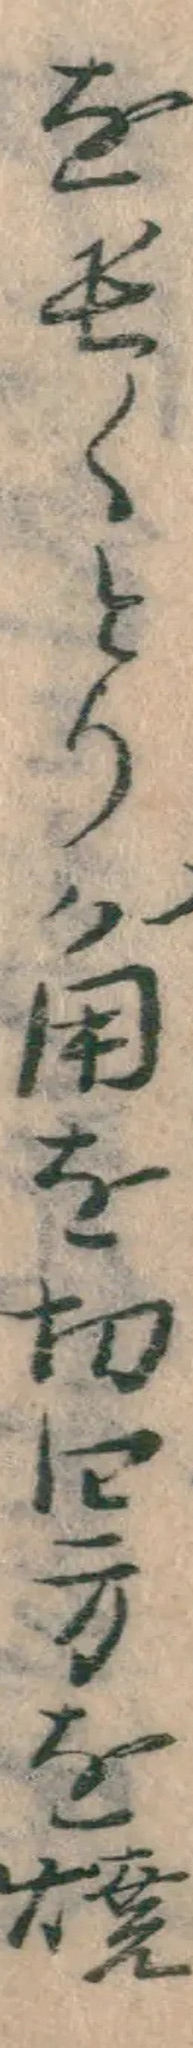を長くとり角を切四方を焼
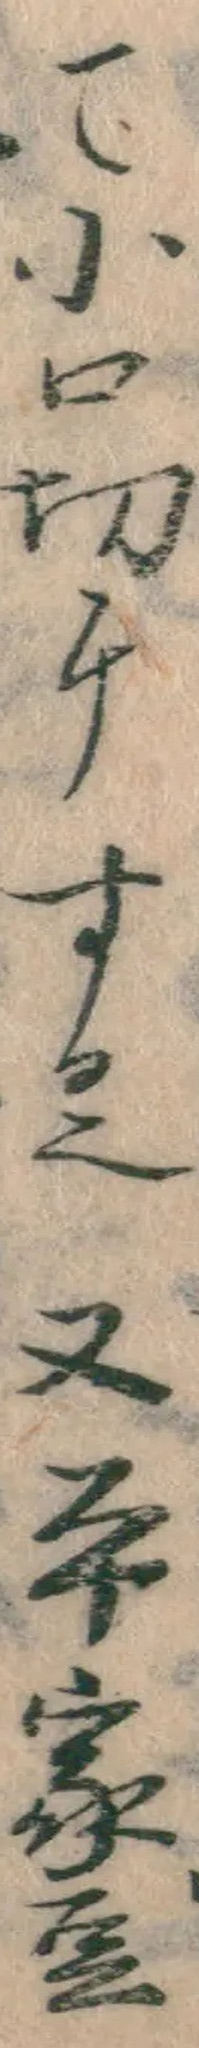て小口切にする也又平家豆
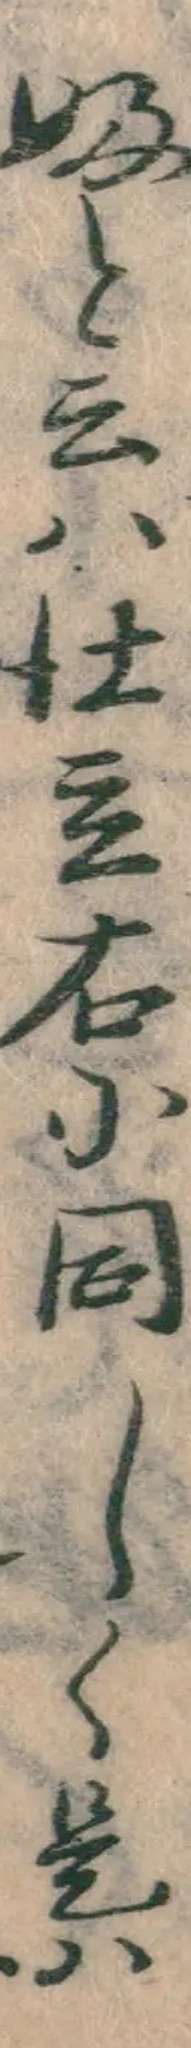ふと云は仕立右に同しく是は
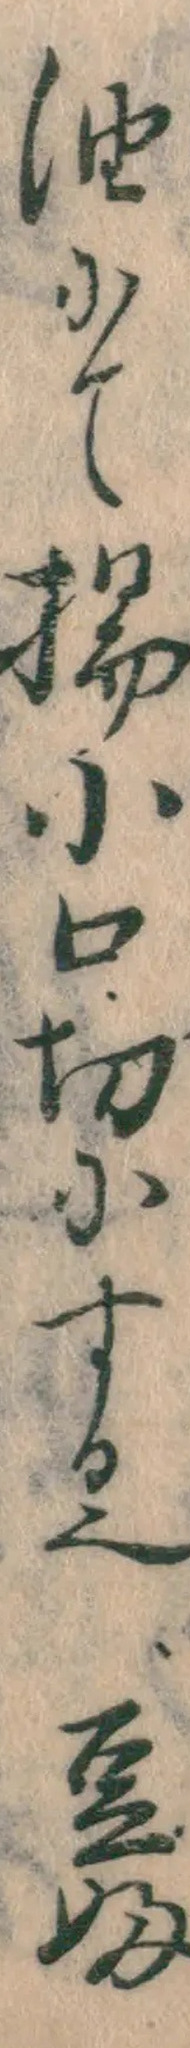油にて揚小口切にする也豆ふ
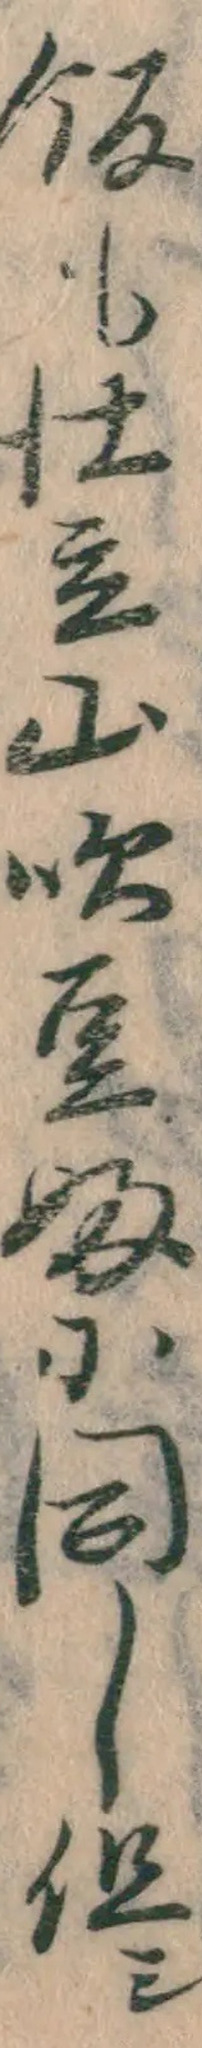飯も仕立山吹豆ふに同し但し
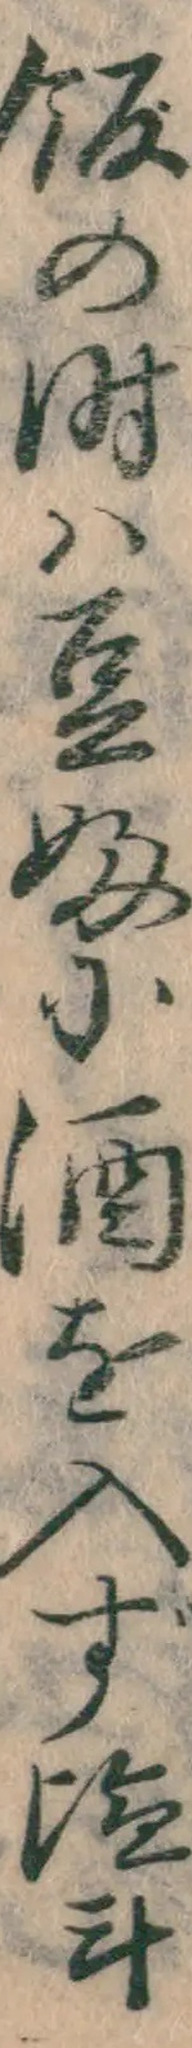飯の時は豆ふに酒を入ず塩斗
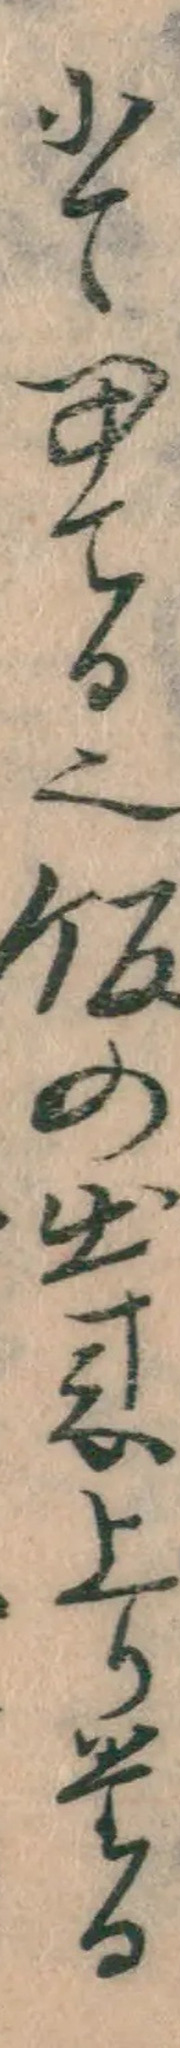にてゆてる也飯の出来上りたる
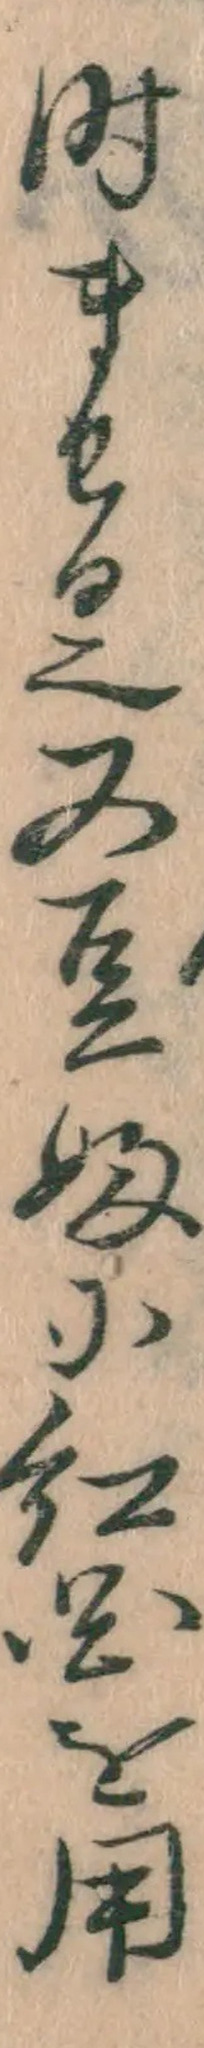時ませる也又豆ふに紅花を用
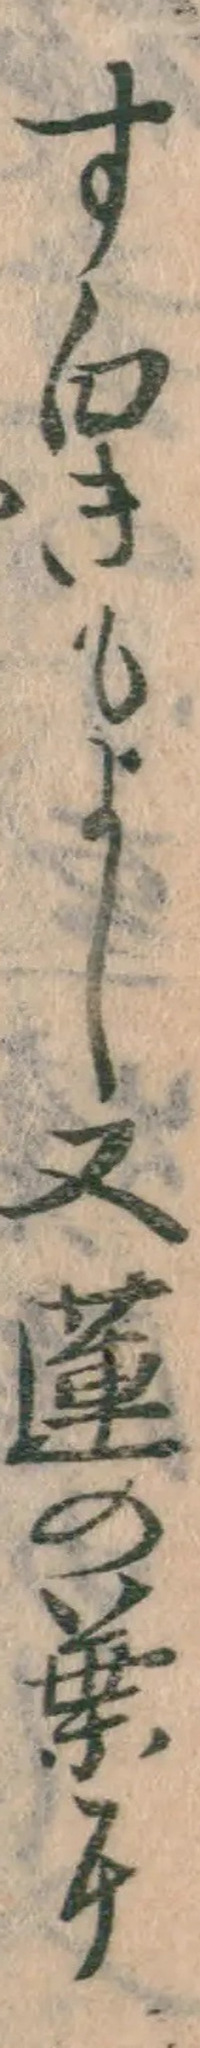す白きもよし又蓮の葉に
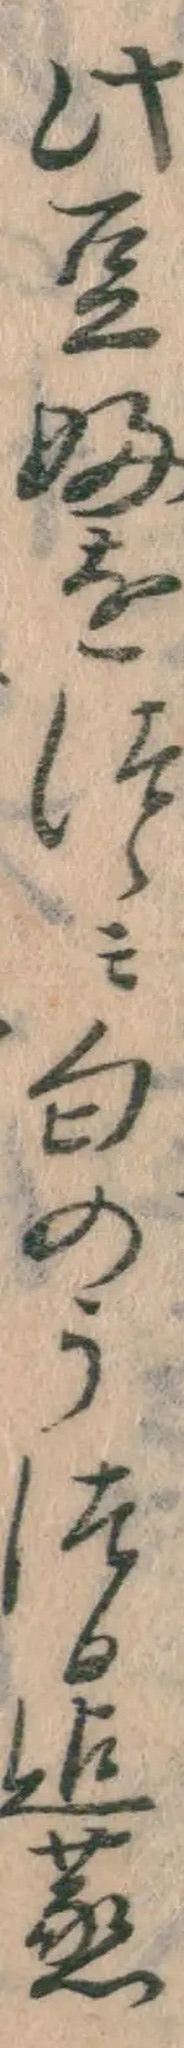此豆ふをつゝみ匂のうつる迄蒸
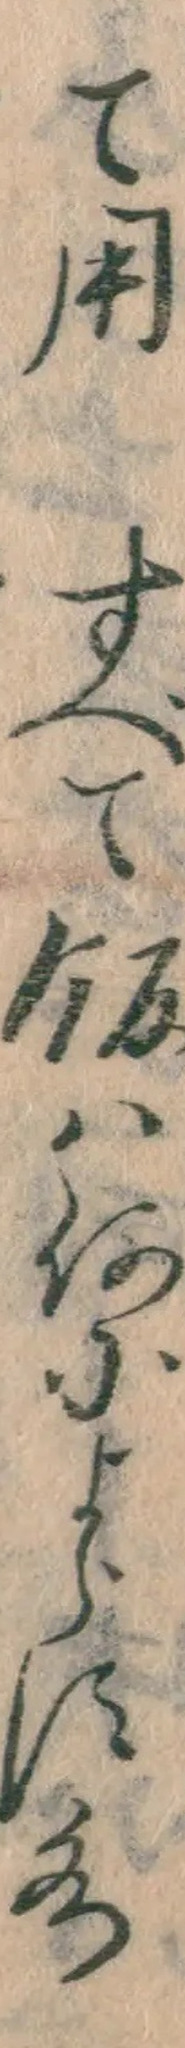て用すべて飯は何によらす水
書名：豆腐百珍余録
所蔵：国立国会図書館 National Diet Library, JAPAN
